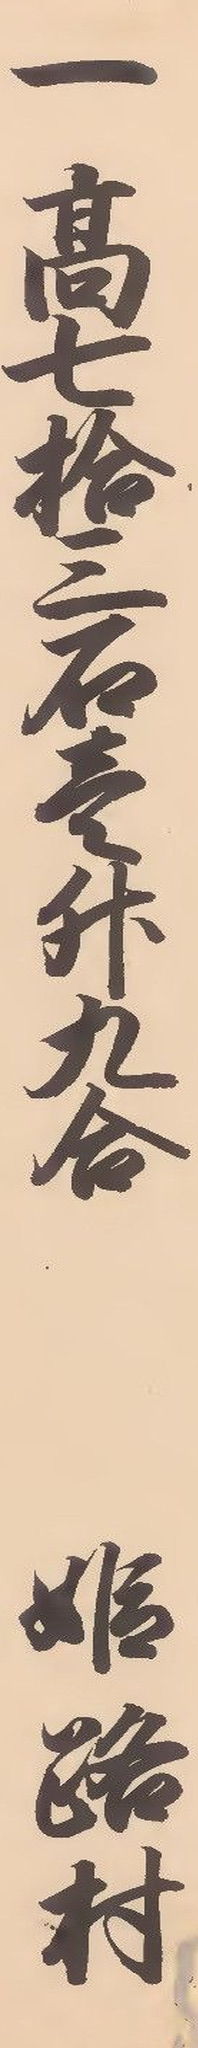一高七拾三石壱升九合姫路村
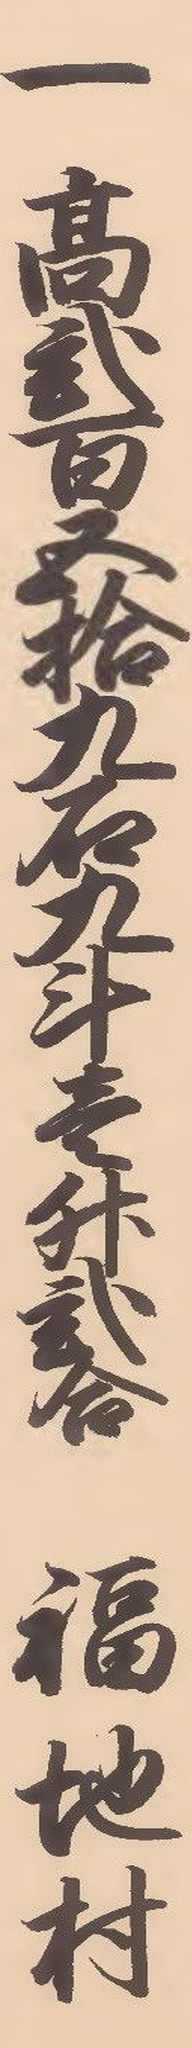一高弐百五拾九石九斗壱升弐合福地村

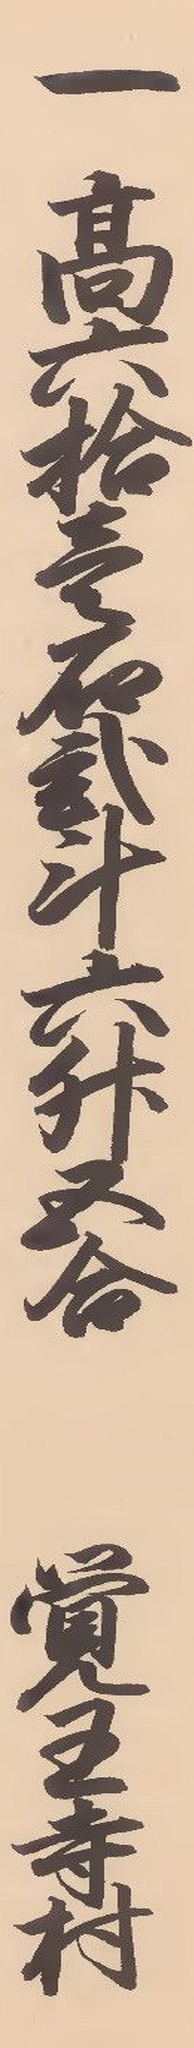一高六拾壱石弐斗六升五合覚王寺村
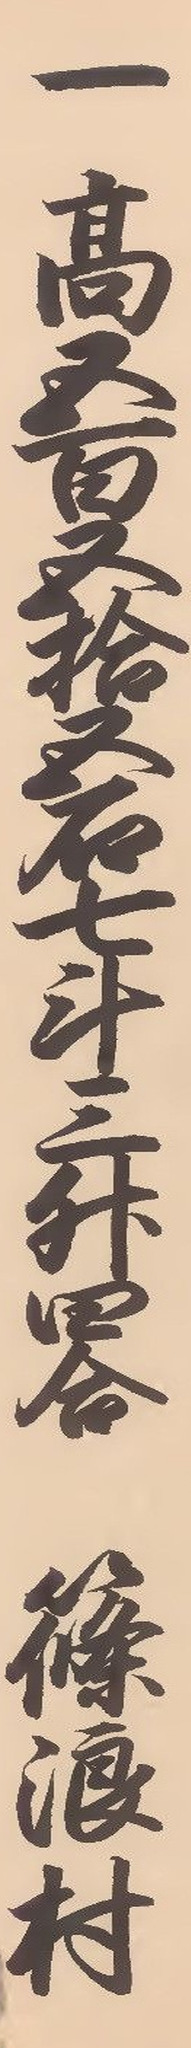一高五百五拾五石七斗三升四合篠浪村
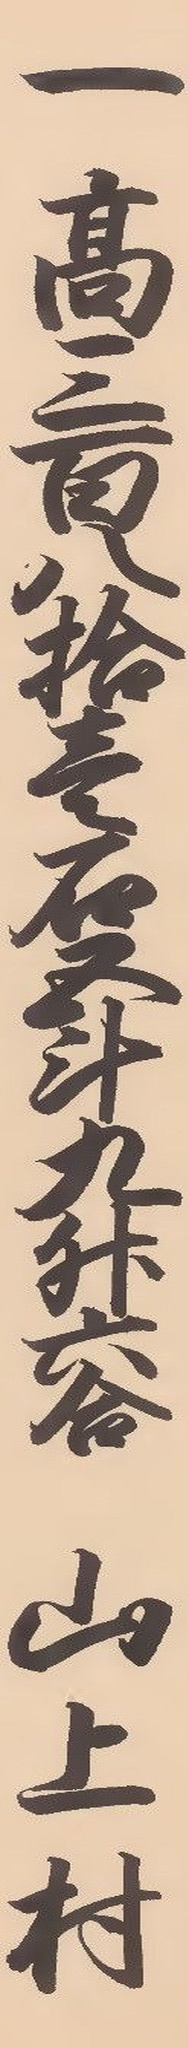一高三百八拾壱石五斗九升六合山上村
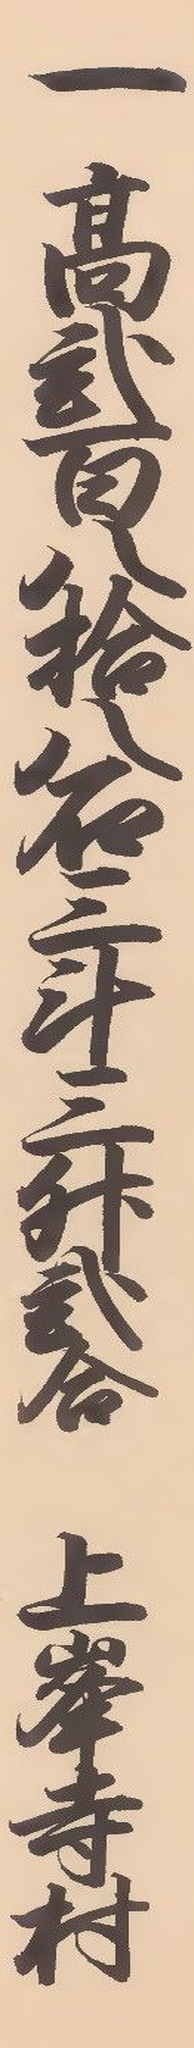一高弐百八拾八石三斗三升弐合上峯寺村
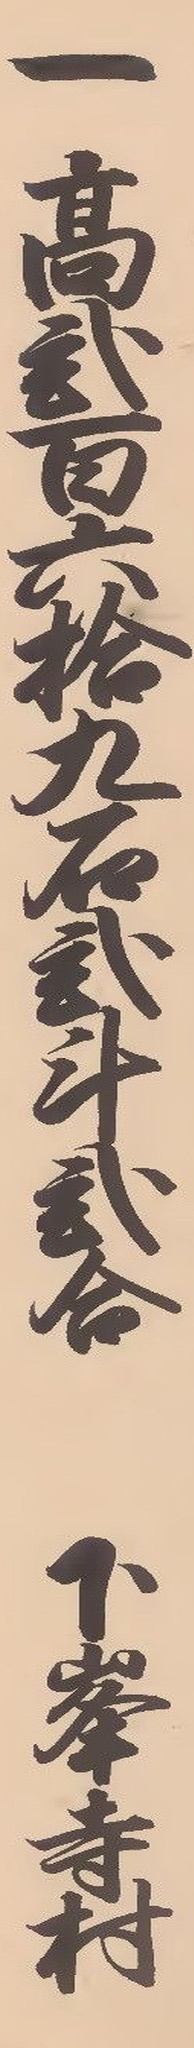一高弐百六拾九石弐斗弐合下峯寺村
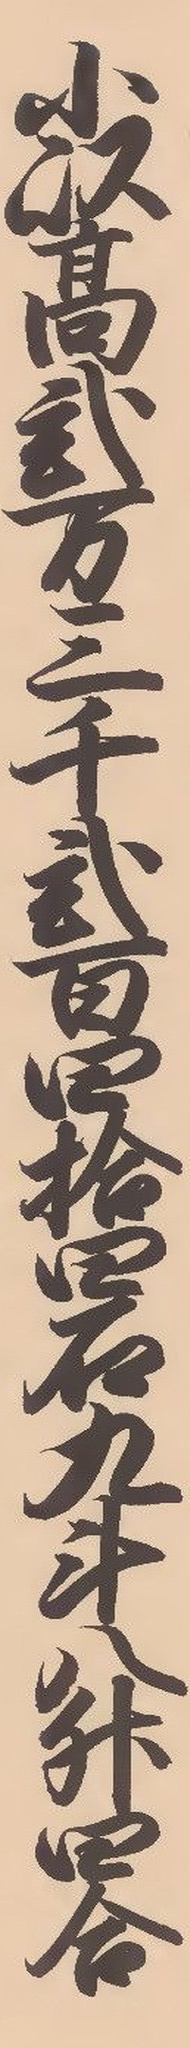小以高弐万三千弐百四拾四石九斗八升四合

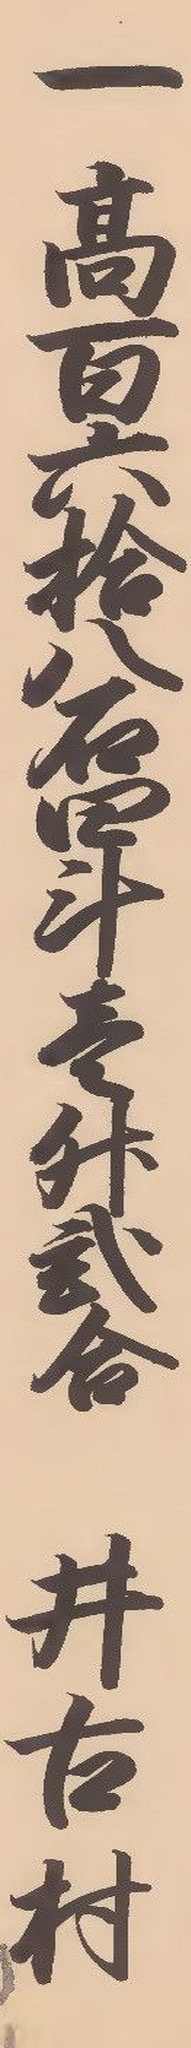一高百六拾八石四斗壱升弐合井古村
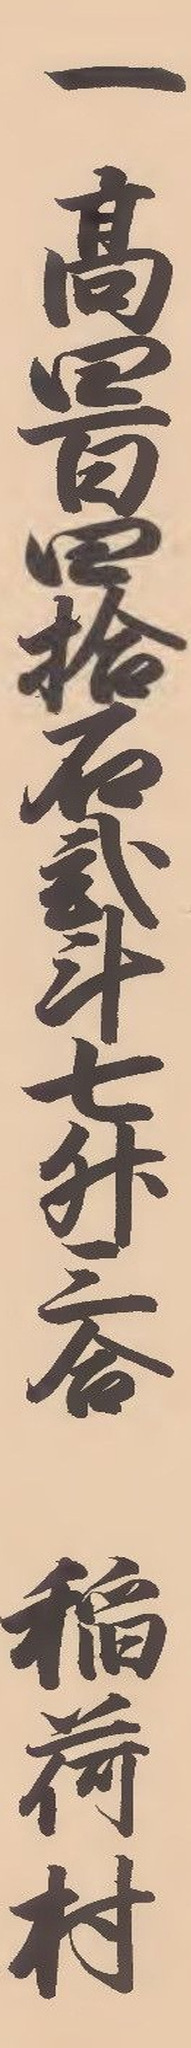一高四百四拾石弐斗七升三合稲荷村
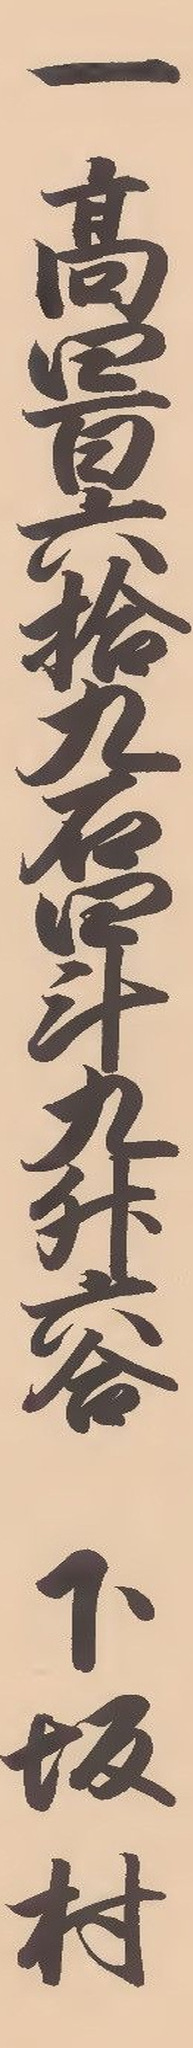一高四百六拾九石四斗九升六合下坂村
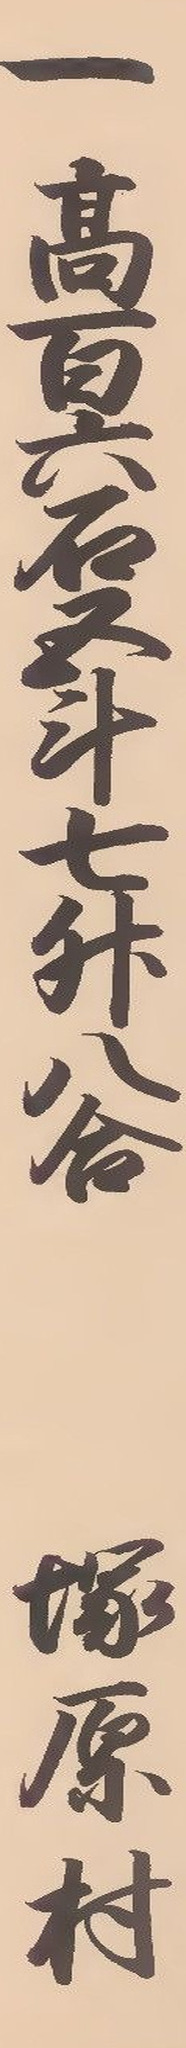一高百六石五斗七升八合塚原村
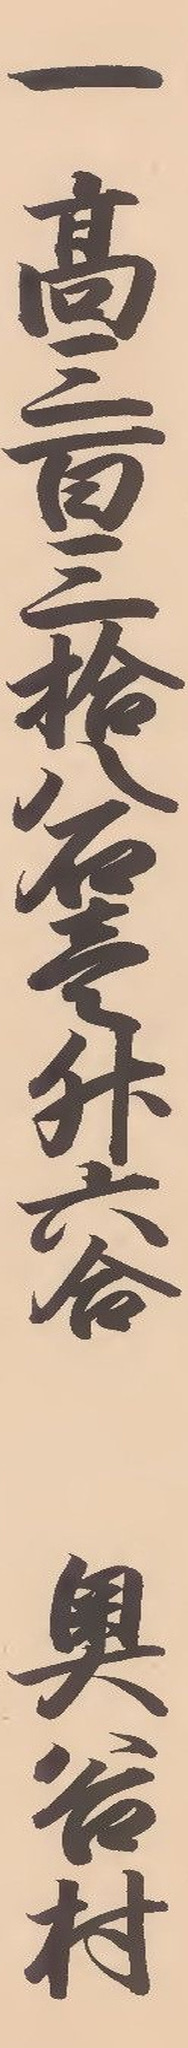一高三百三拾八石壱升六合奥谷村
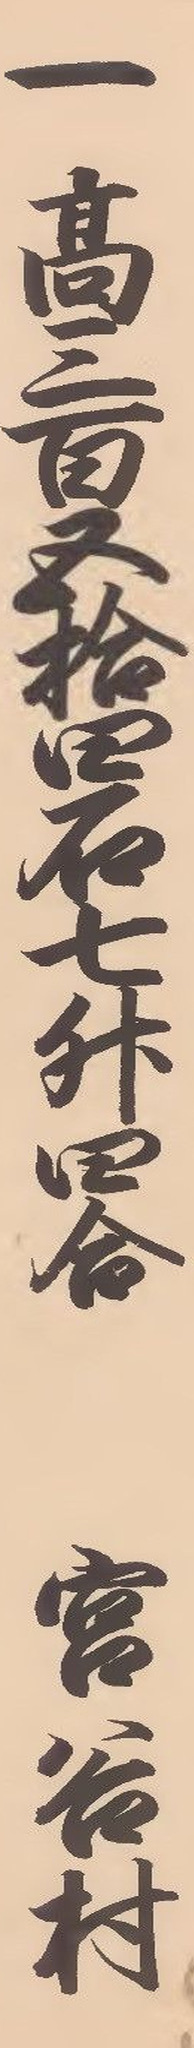一高三百五拾四石七升四合宮谷村
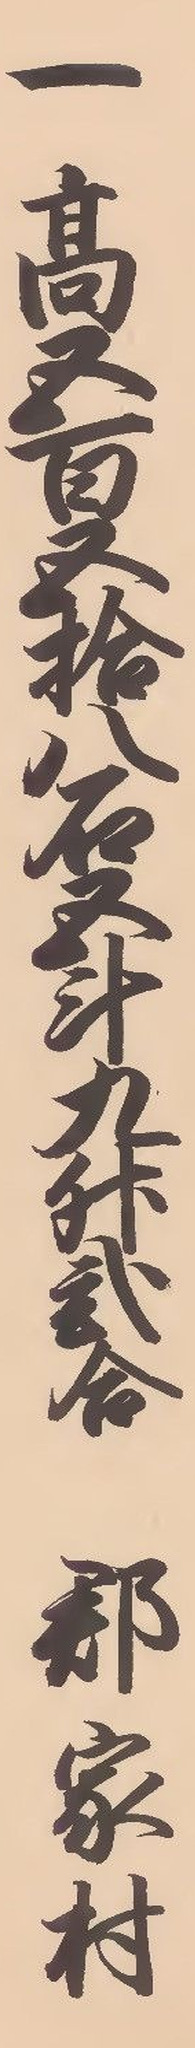一高五百五拾八石五斗九升弐合郡家村

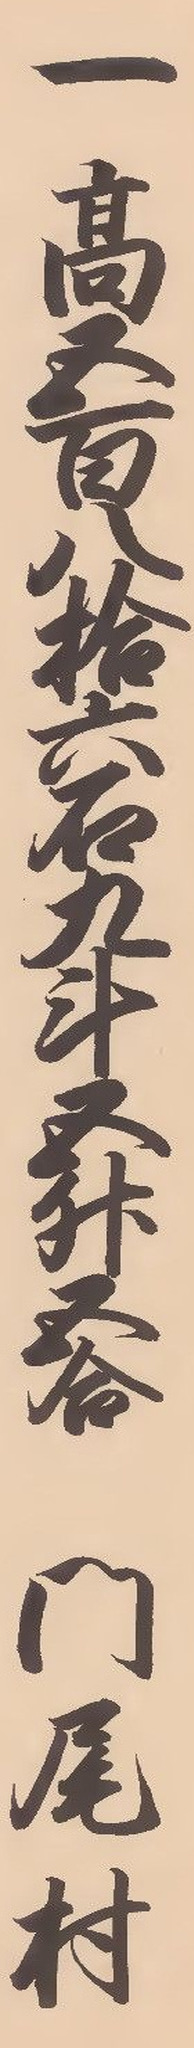一高五百八拾六石九斗五升五合門尾村
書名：因幡国郷帳
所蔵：国立公文書館 National Archives of Japan
